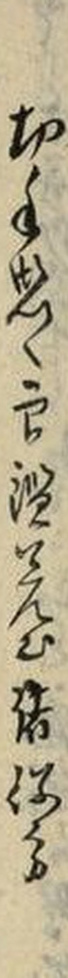切手御門へ印鑑差出諸役方
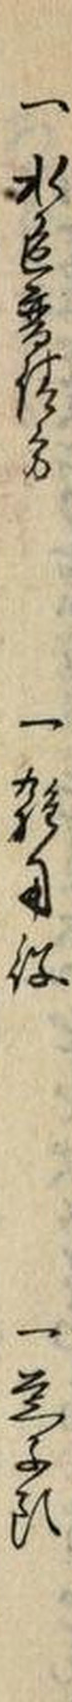一水道普請方一雑用役一荒子頭
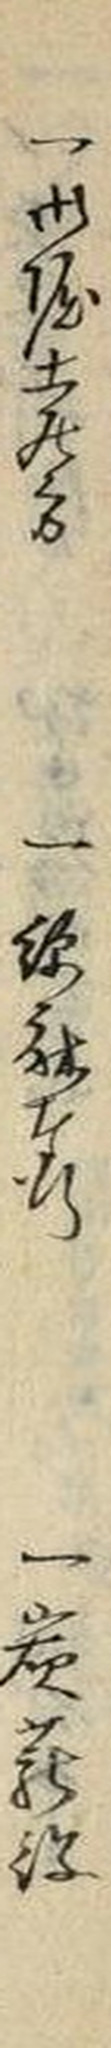一御堀土居方一綿麻奉行一炭薪役
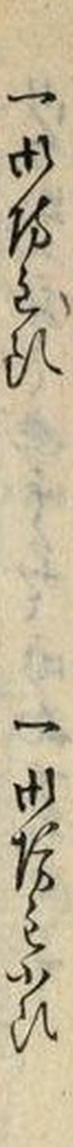一御坊主頭一御坊主小頭
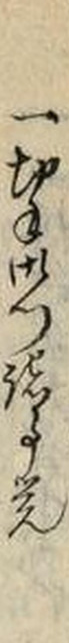一切手御門諸事覚
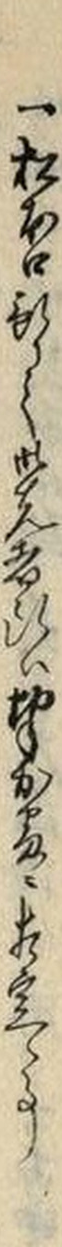一松本口預り之御先者頭は切手加番に相定候事
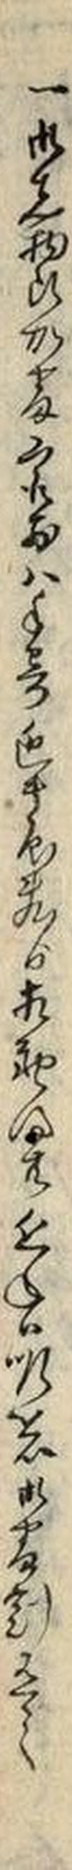一御先物頭加番最前は手寄近き屋敷ゟ相勤候得共近年は順を以御番割有之
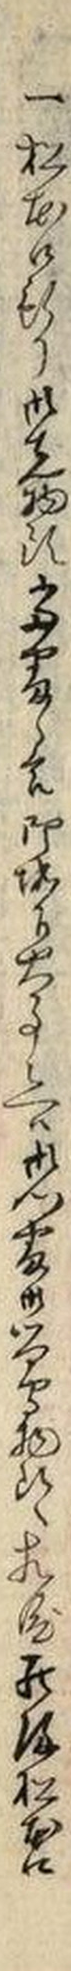一松本口御預り御先物頭当番之節御城下火事候へは御門番御留守物頭へ相渡罷帰松本口
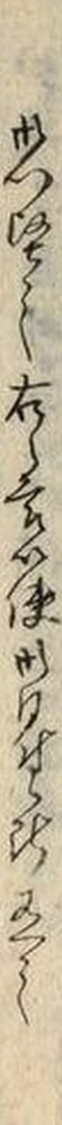御門堅之右之節以使御目付へ断有之
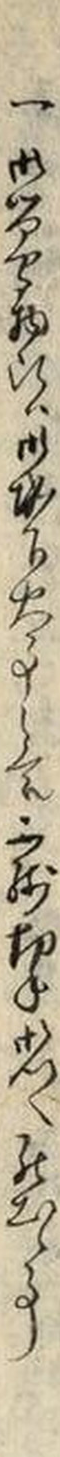一御留守物頭は御城下火事之節不残切手御門へ罷出候事
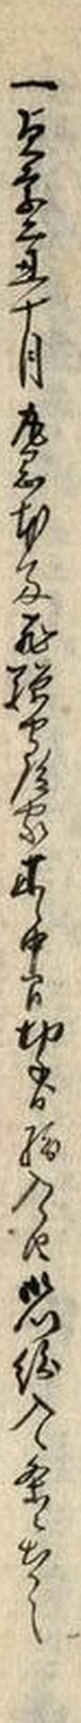一貞享二丑十月丸岡本多飛驒守殿家来之中間切手ゟ紛入候儀御門紛入之条に出之
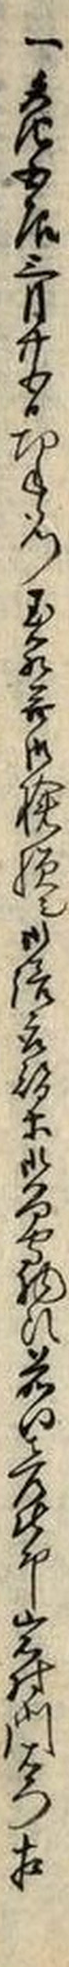一文化五辰三月廿五日切手御門玉箱并御鎗損し御繕取替等御留守物頭前田彦次郎岩村門右衛門相
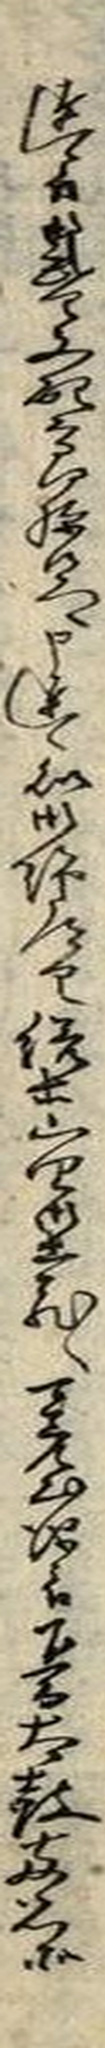達候に付御武具支配高田孫左衛門へ申達候処御飾道具繕等山里御土蔵へ可差出候儀に付下馬太鼓両御番所
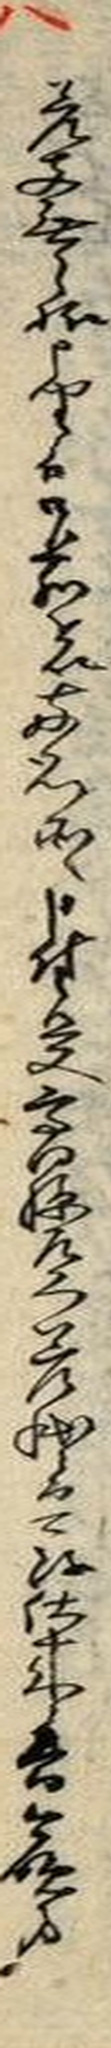差支無之様申聞候付御口上扣を以両御番所へ申付候且又高田孫左衛門差紙に而可致仕来旨今晩方

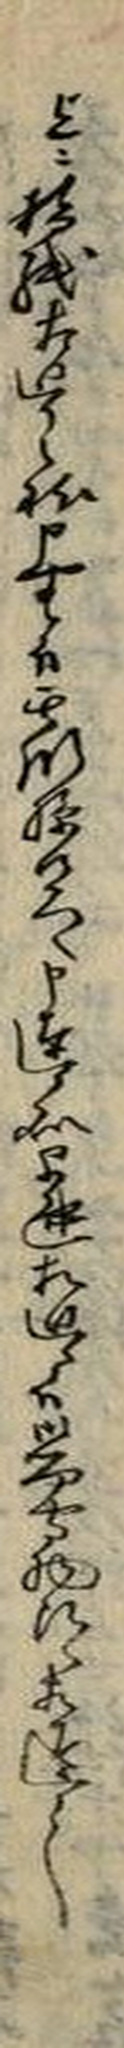迄に指紙相廻り候様申聞候に付其段孫左衛門へ申達候処早速相廻候付御留守物頭へ相達之
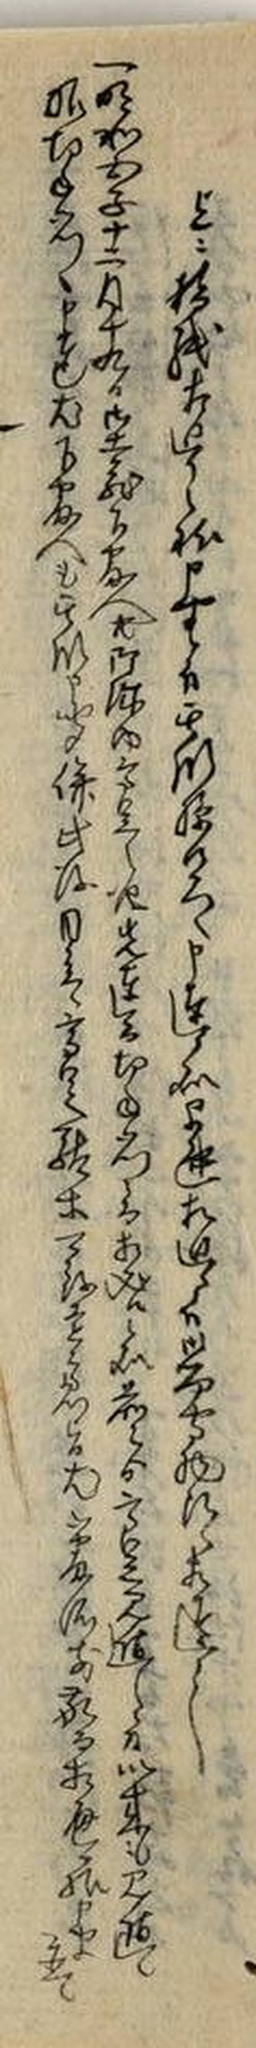一明和五子十二月十九日御土蔵下番人共御城内高足之儀先達而切手御門に而相咎候処前々ゟ高足見遁候に付以来も見遁候
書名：御門御櫓之部
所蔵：福井県文書館 Fukui Prefectural Archives
